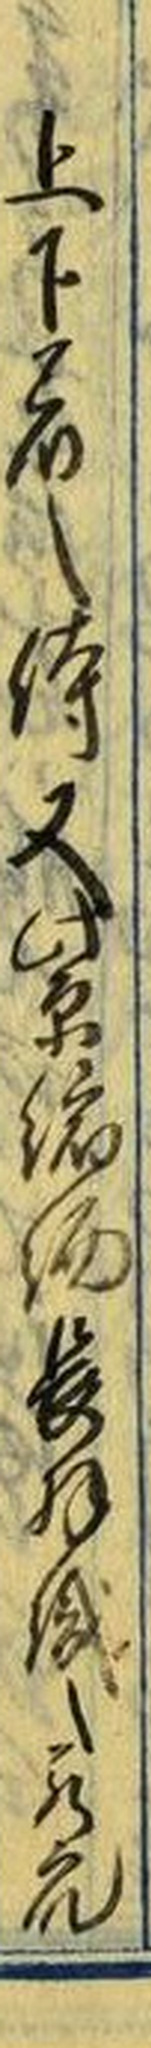上下着之侍又紫縮緬長羽織之若衆
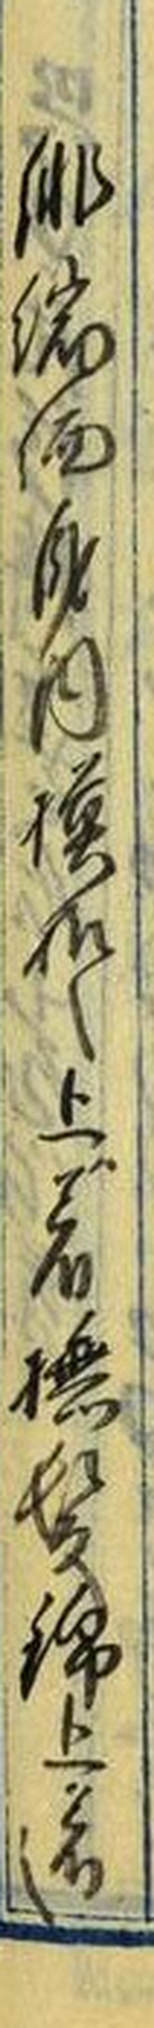緋縮緬身内模様之上は着撫髪錦上着之
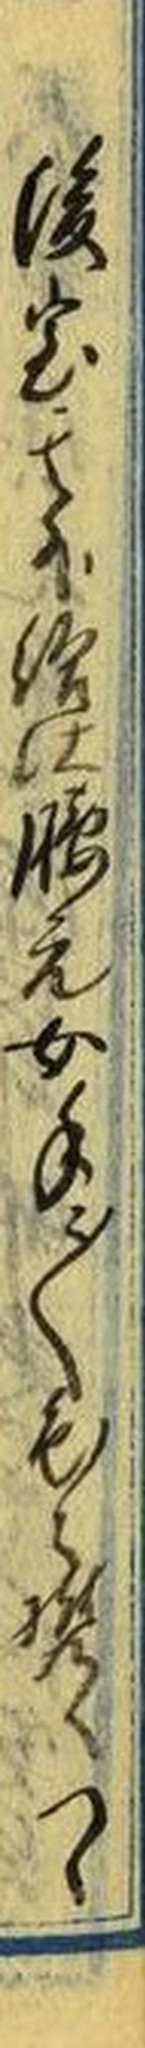後室其外絡仕腰元女手に〳〵色ゝ携へつゝ
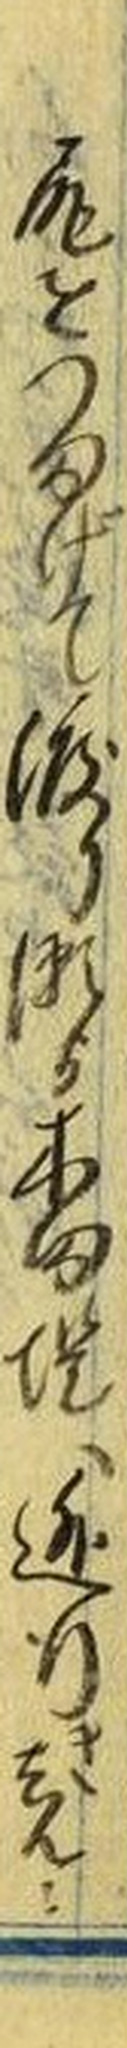尻をつまげて渡り瀬ゟ木田堤へ逃行き去んに
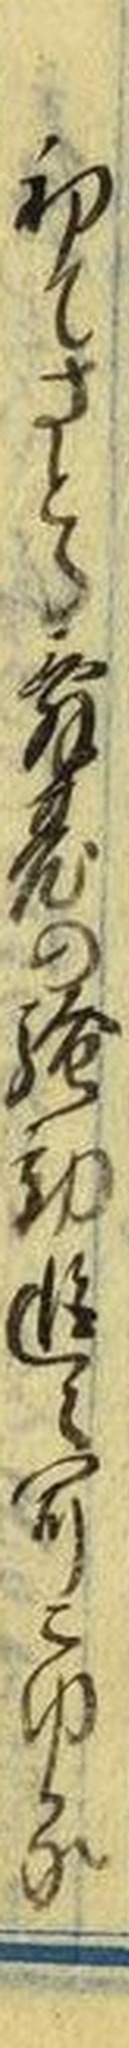初てさとる舞台の騒動追々聞こゆる
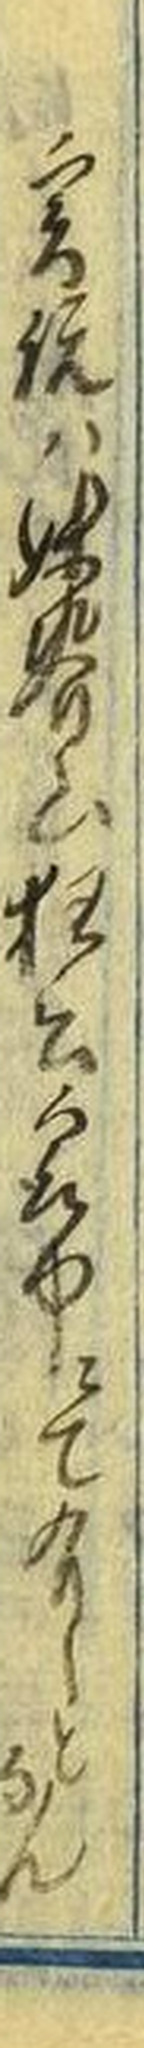実説は妹背山狂言最中にて有しとなん
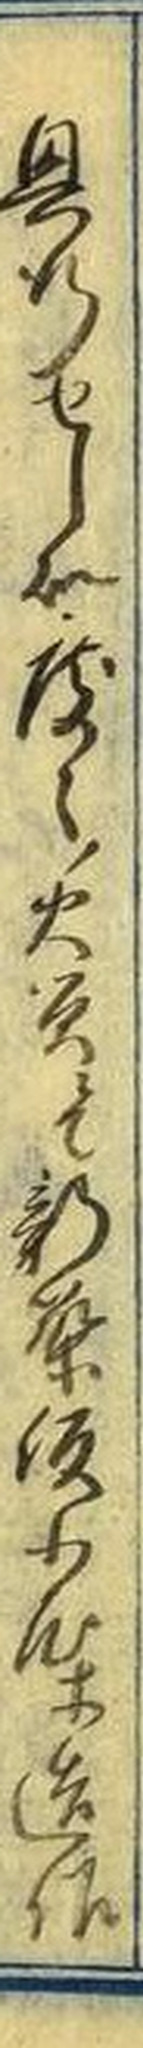興行せし処度々の火災にて新築仮小屋等造作
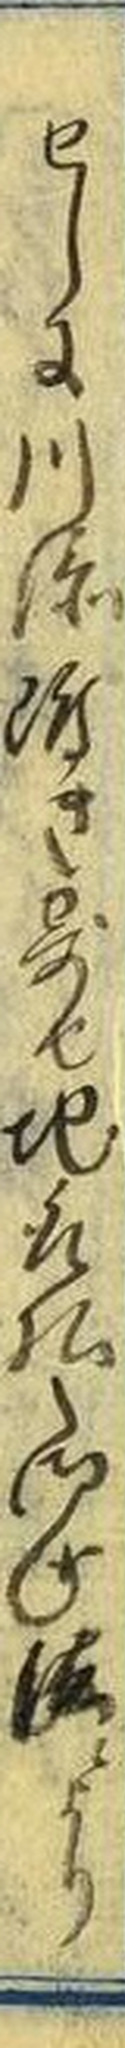せしに川添附き寄せ地取払之御趣法により
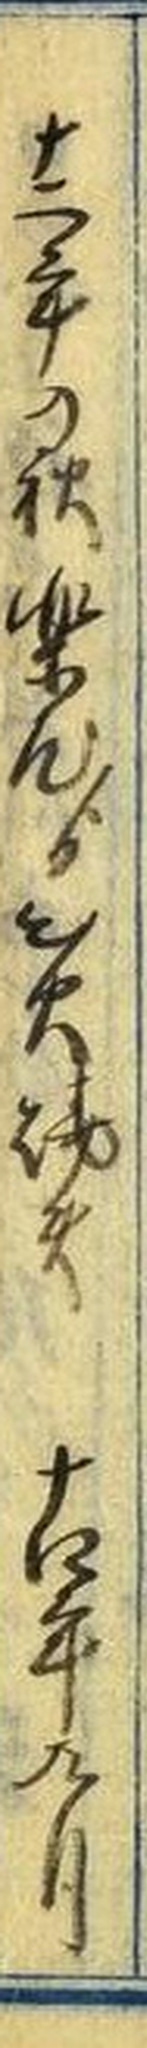十二年の秋楽屋ゟ出火焼失十四年九月
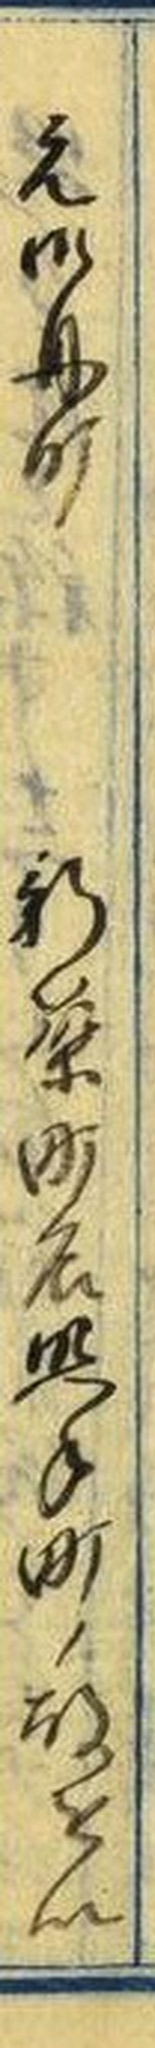元御舟町新築町名照手町の故を以

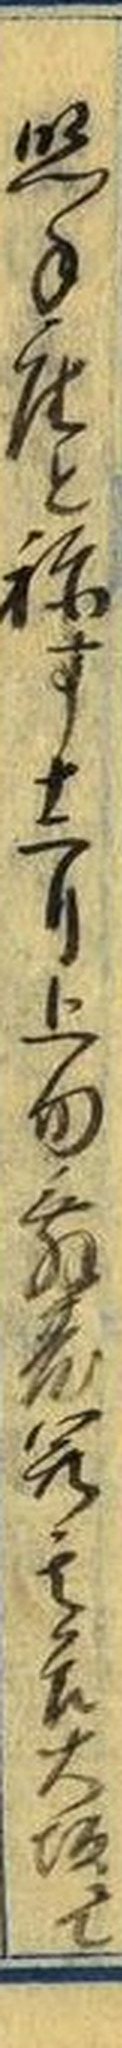照手座と称す十二月上旬舞台開其節大坂にて
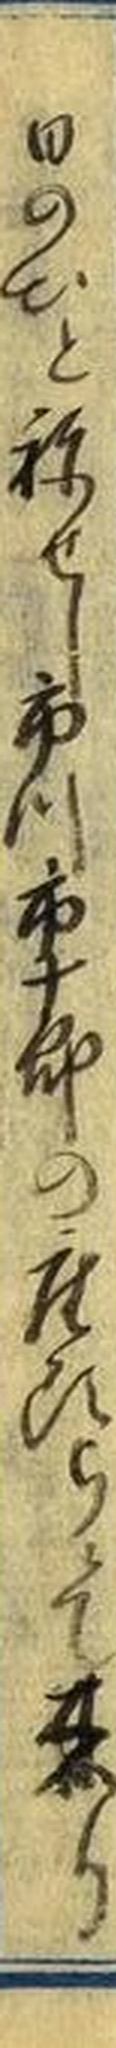日の出と称せし市川市十郎の座頭らにて来り
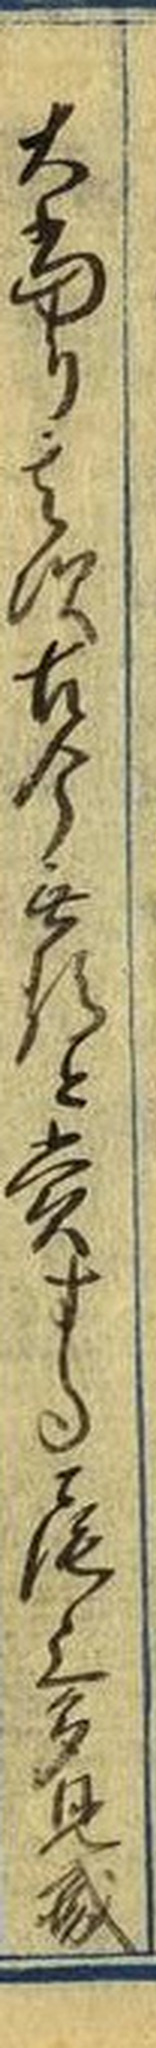大当り其次古今無類と賞する尾上多見蔵
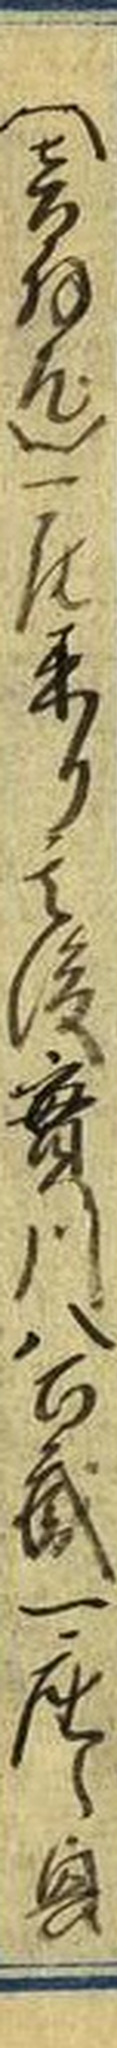(音羽屋)一座来り其後実川八百蔵一座之興
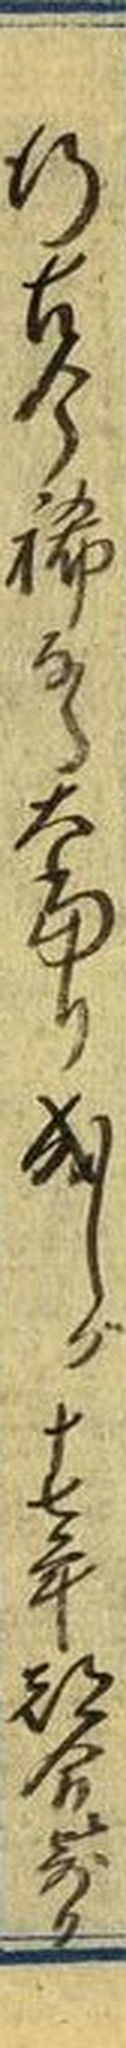行古今稀なる大当り成しが十七年都合に寄り
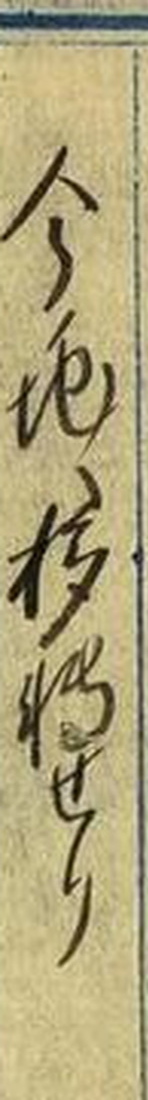今の地へ移転せり
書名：温古集 五巻
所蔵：福井県文書館 Fukui Prefectural Archives
